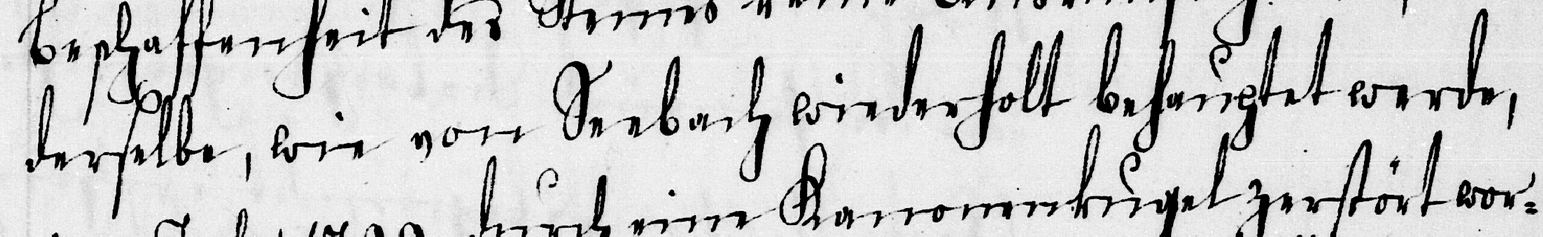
derselbe, wie von Seebach wiederholt behauptet werde,
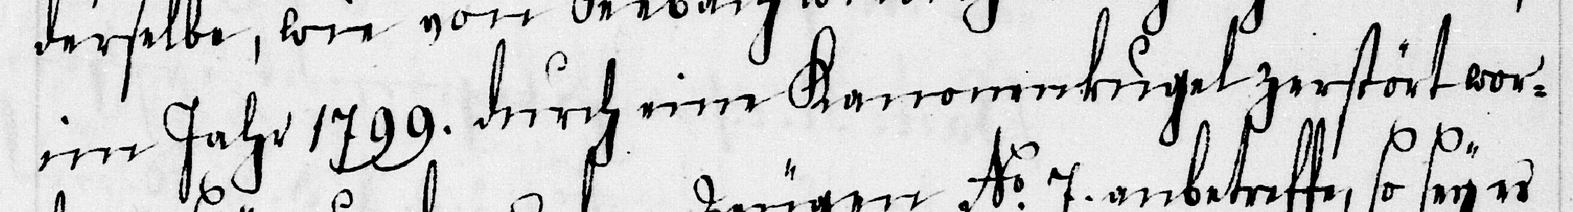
im Jahr 1799. durch eine Kanonenkugel zerstört wor¬
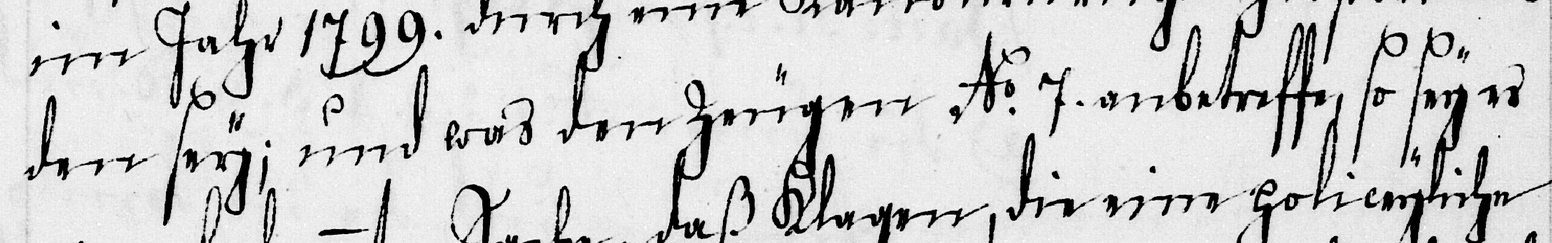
den sey; und was den Zeugen No. 7. anbetreffe, so sey
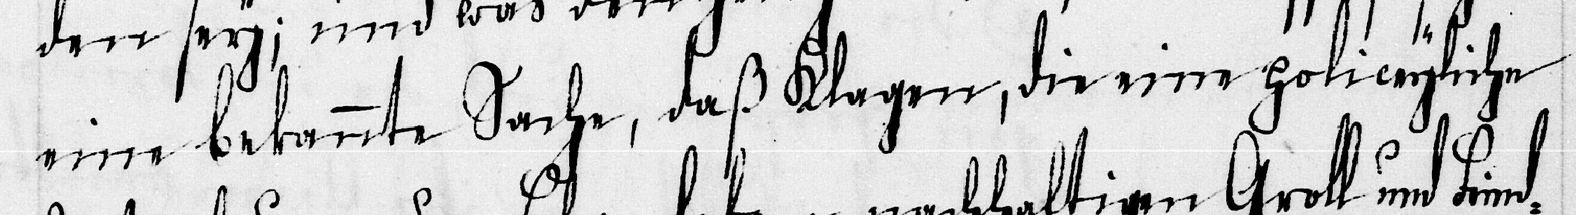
eine bekannte Sache, daß Klagen, die eine policeyliche
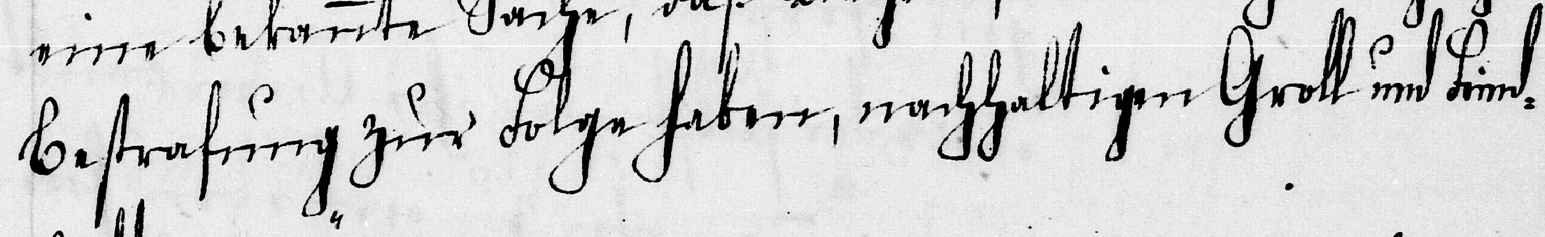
Bestrafung zur Folge haben, nachhaltigen Groll und Fei¬
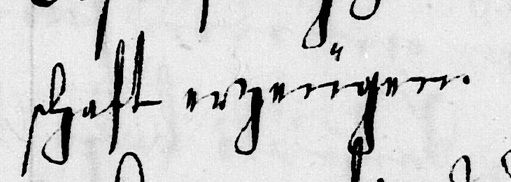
schaft erzeugen.
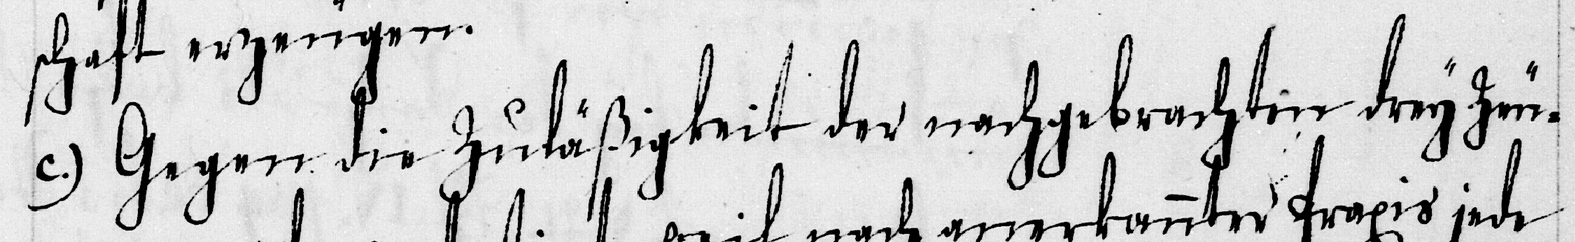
c.) Gegen die Zuläßigkeit der nachgebrachten drey Zeu¬
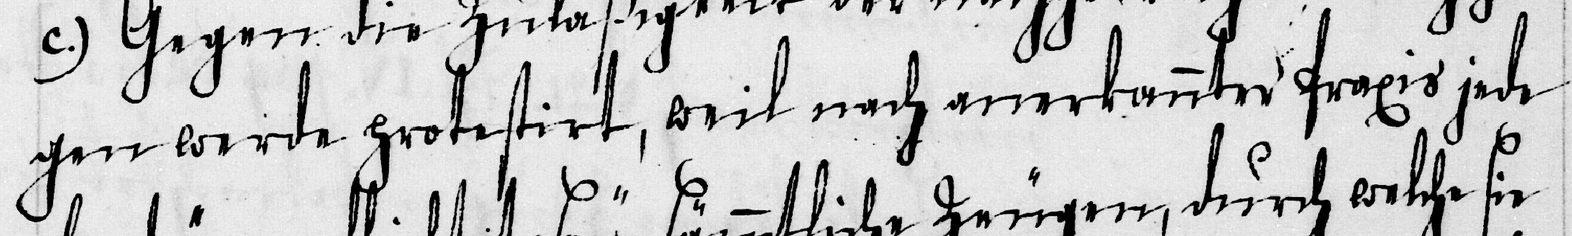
gen werde protestirt, weil nach anerkannter Praxis jede
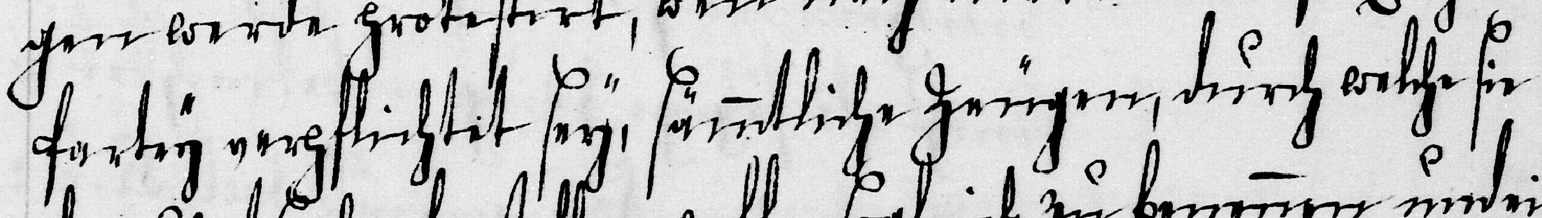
Partey verpflichtet sey, sämmtliche Zeugen, durch welche s¬
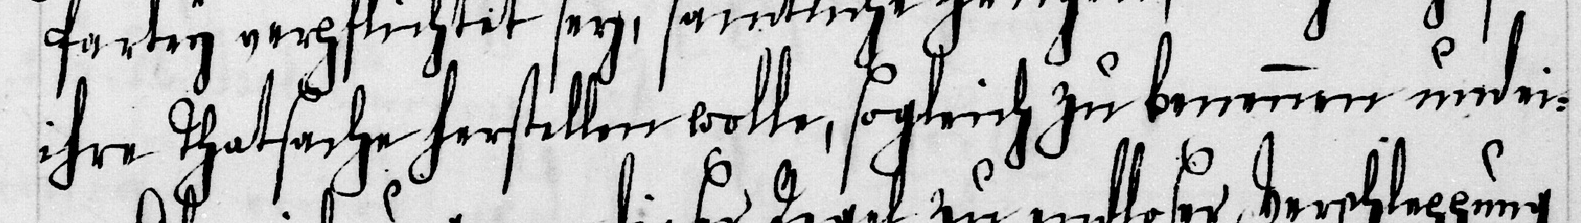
ihre Thatsache herstellen wolle, sogleich zu benennen und ei¬
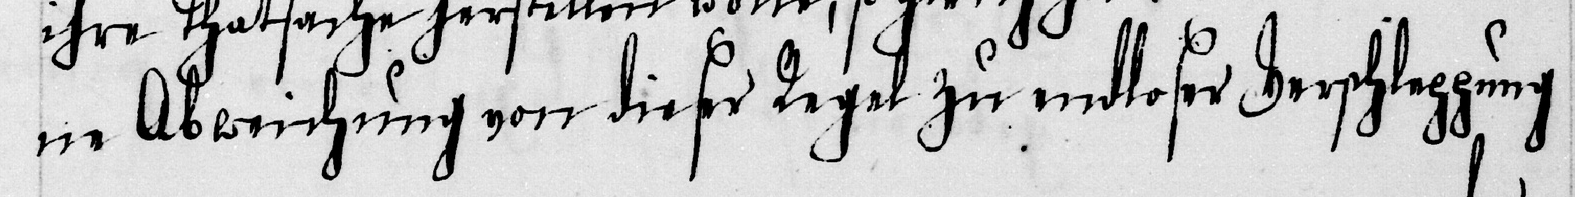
ne Abweichung von dieser Regel zu endloser Verschleppung
